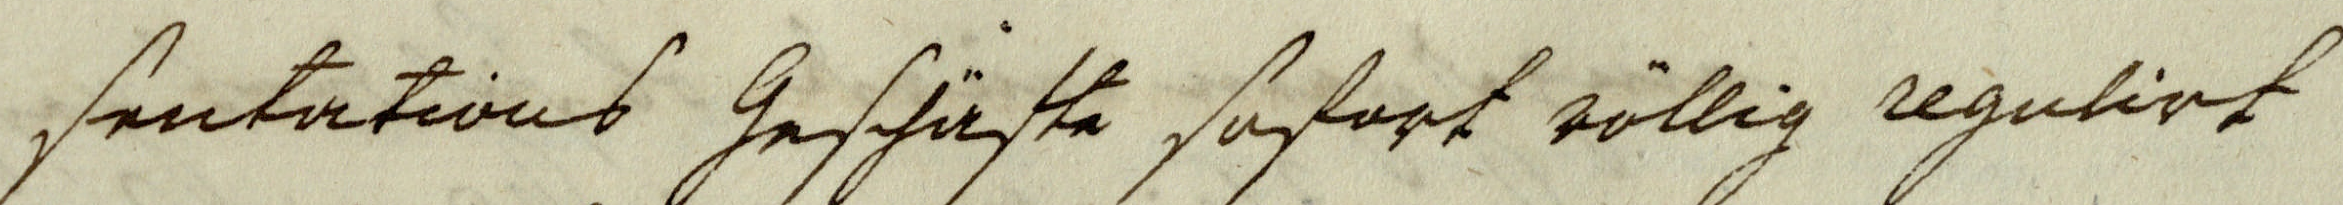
sentations Geschäfte sofort völlig regulirt
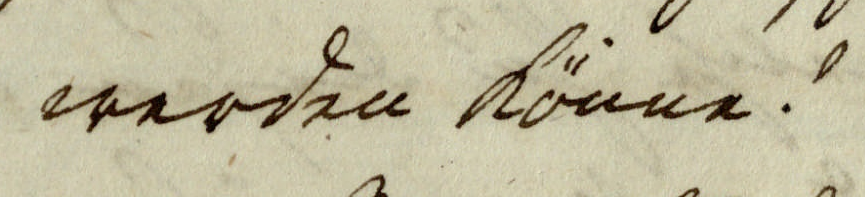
werden könne?
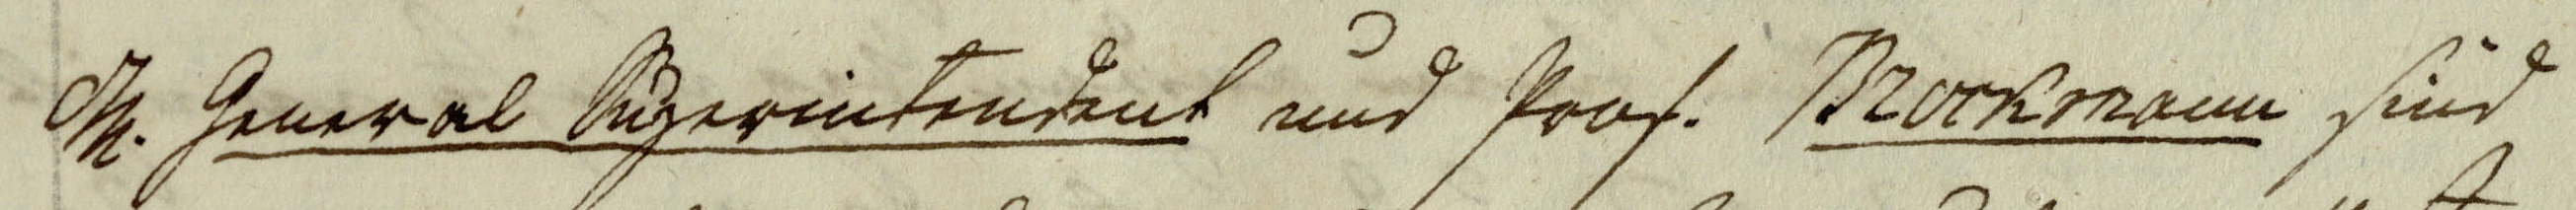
dh. General Superintendent und Prof. Brockmann sind
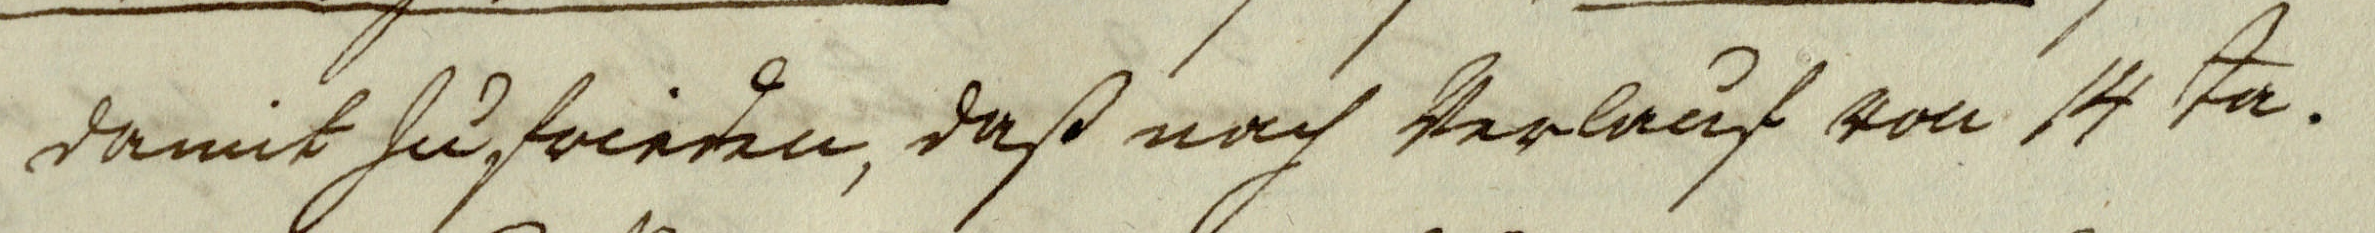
damit zufrieden, daß nach Verlauf von 14 Ta¬
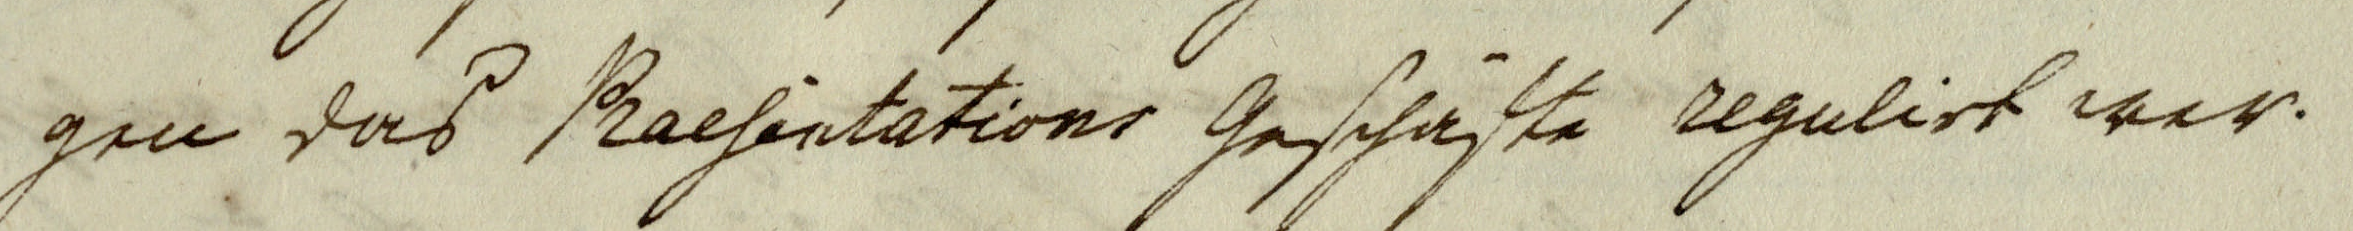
gen das Praesentations Geschäfte regulirt wer¬
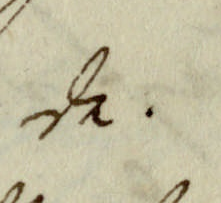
de.
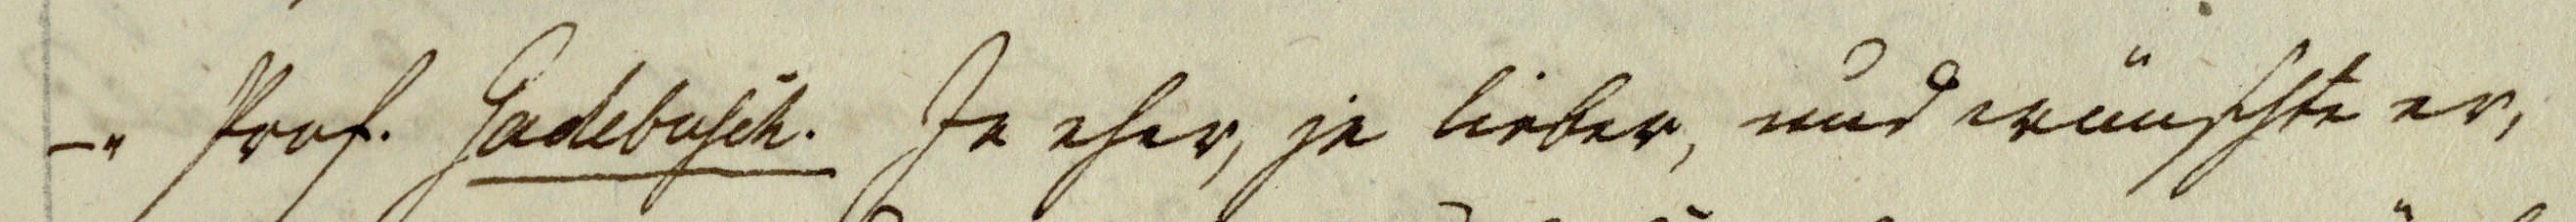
— " Prof. Gadebusch. Je eher, je lieber, und wünschte er,
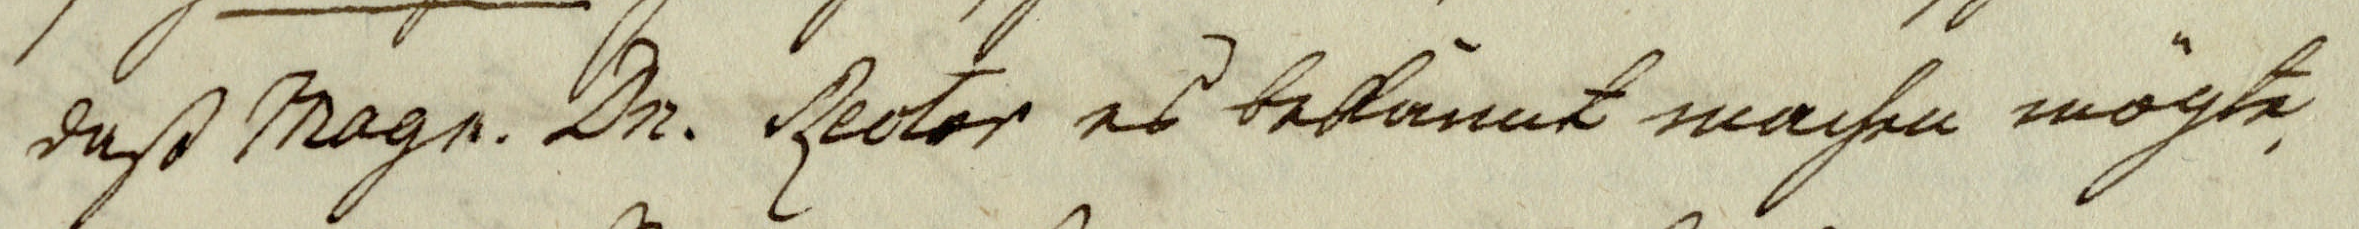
daß Magn. Dn. Rector es bekannt machen mögte,
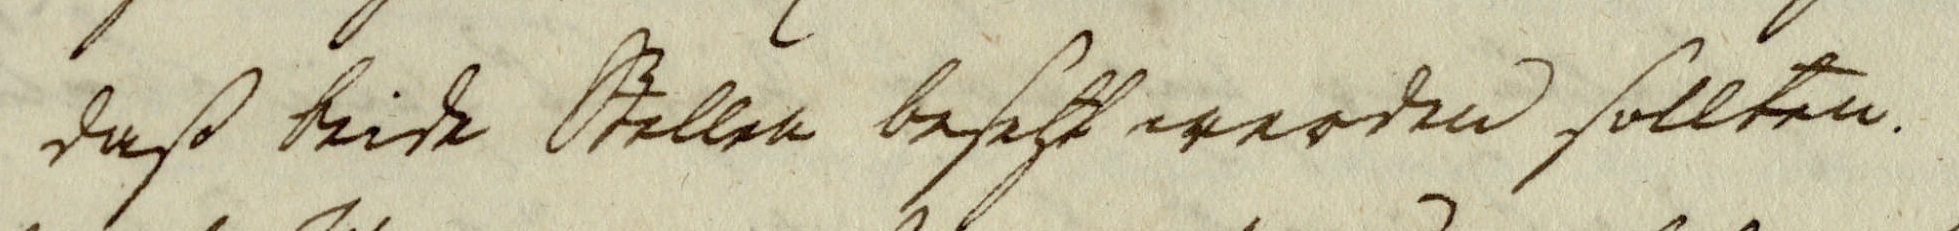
daß beide Stellen besetzt werden sollten.
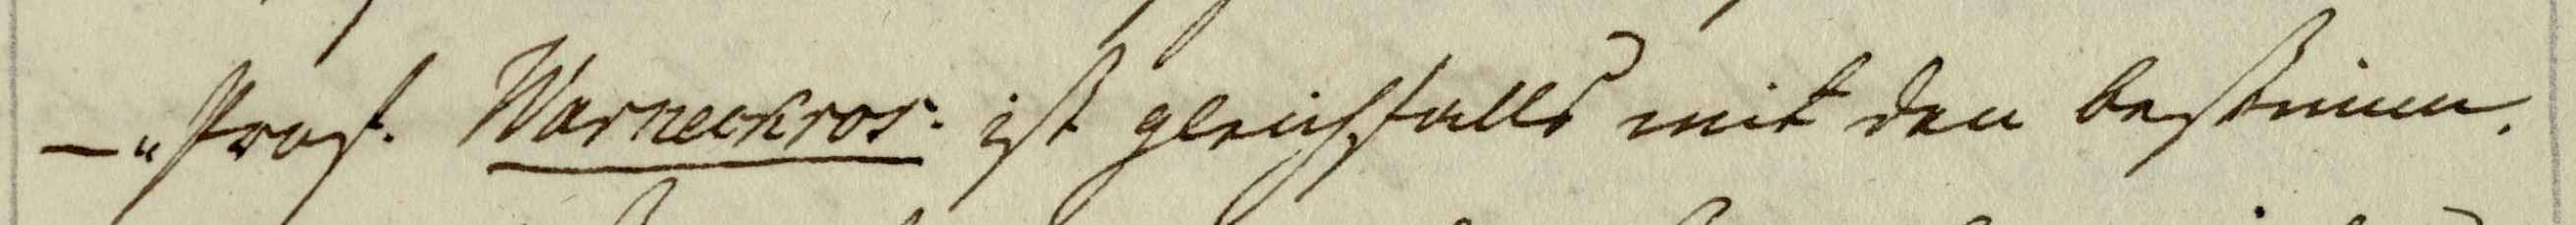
— " Prof. Warneckros. ist gleichfalls mit den bestimm¬
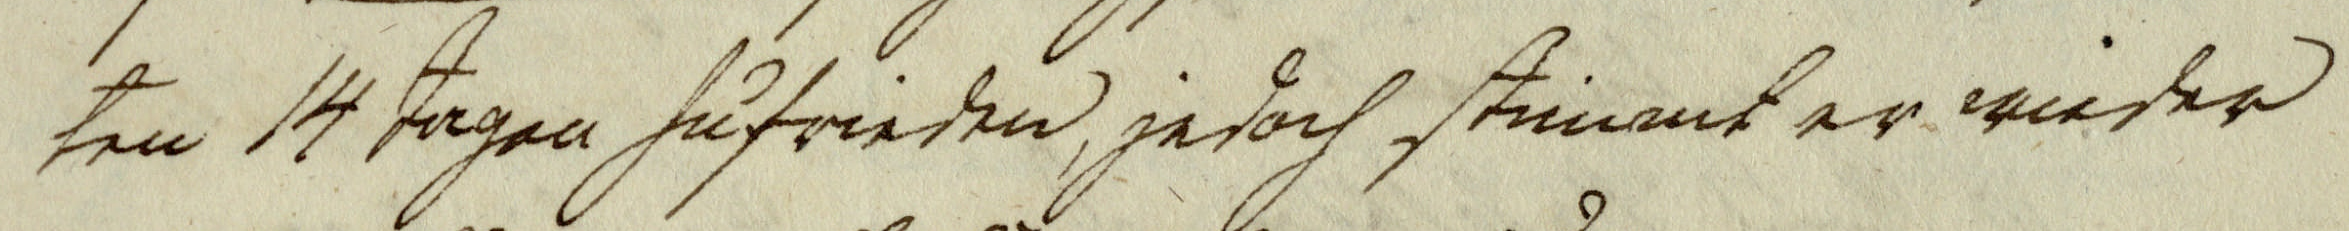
ten 14 Tagen zufrieden, jedoch stimmt er wieder
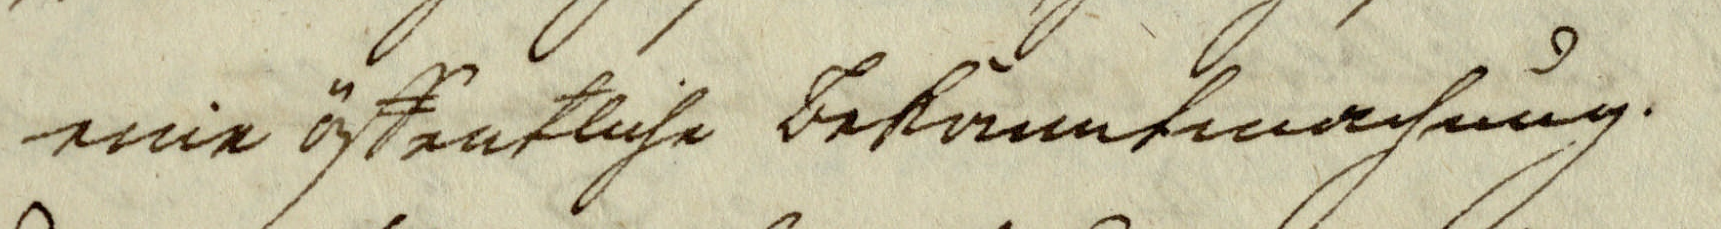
eine öffentliche Bekanntmachung.
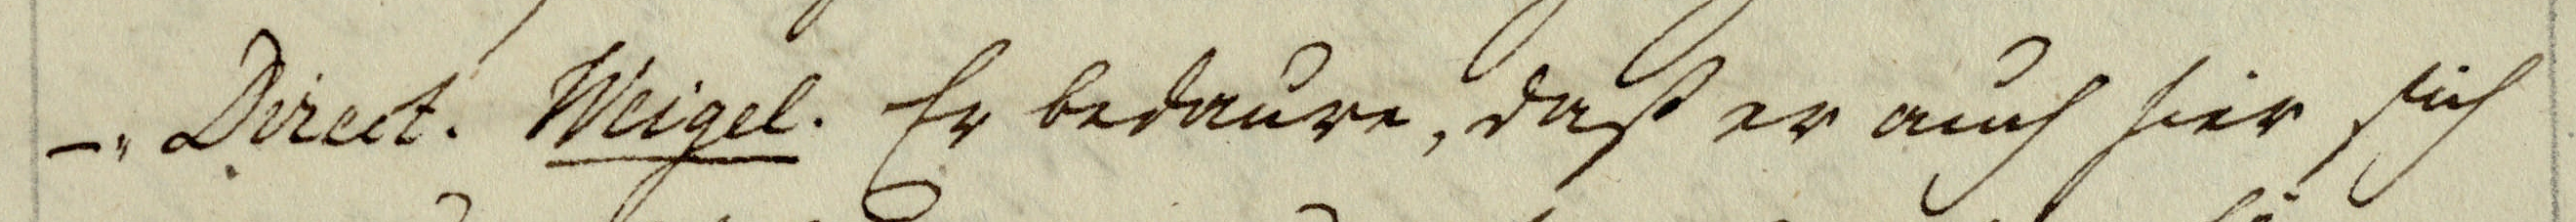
— " Direct. Weigel. Er bedaure, daß er auch hier sich
